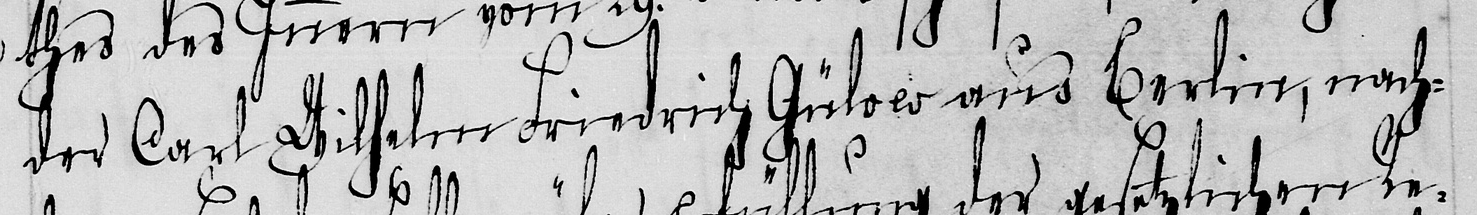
der Carl Wilhelm Friedrich Gülow aus Berlin, nach¬
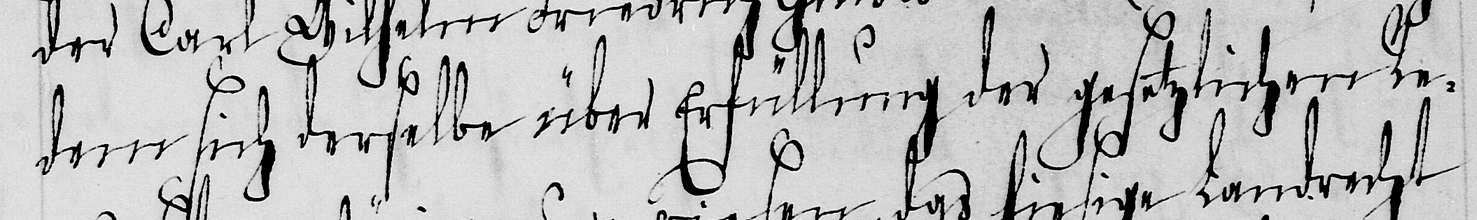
dem sich derselbe über Erfüllung der gesetzlichen Re¬
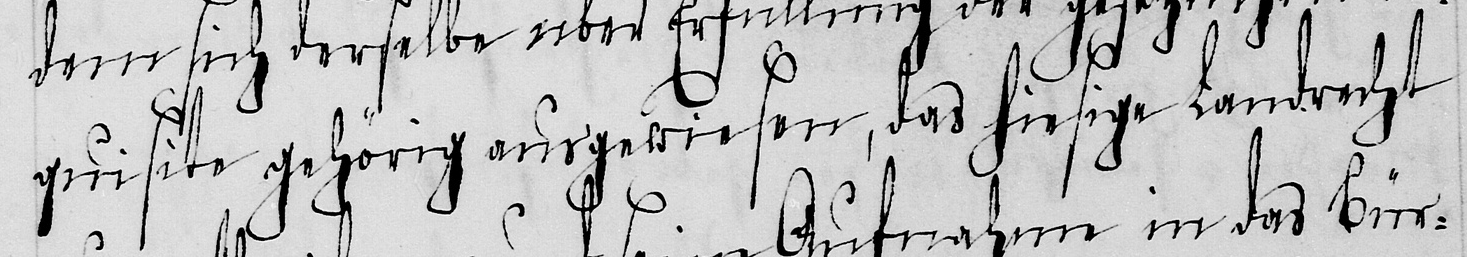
quisite gehörig ausgewiesen, das hiesige Landrecht
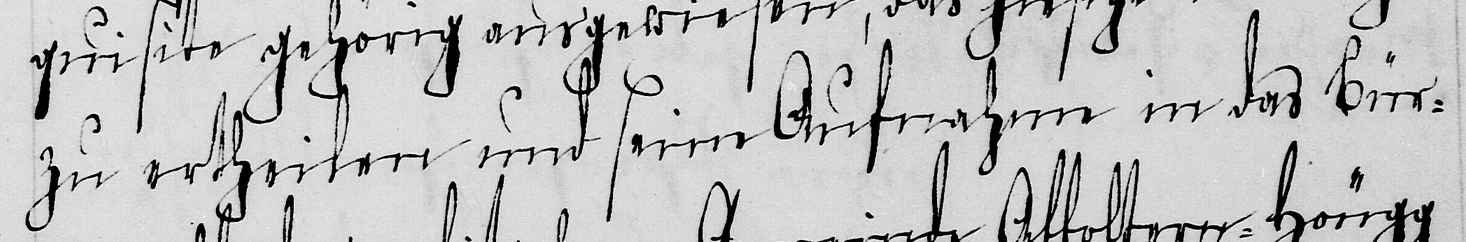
zu ertheilen und seine Aufnahme in das Bür¬
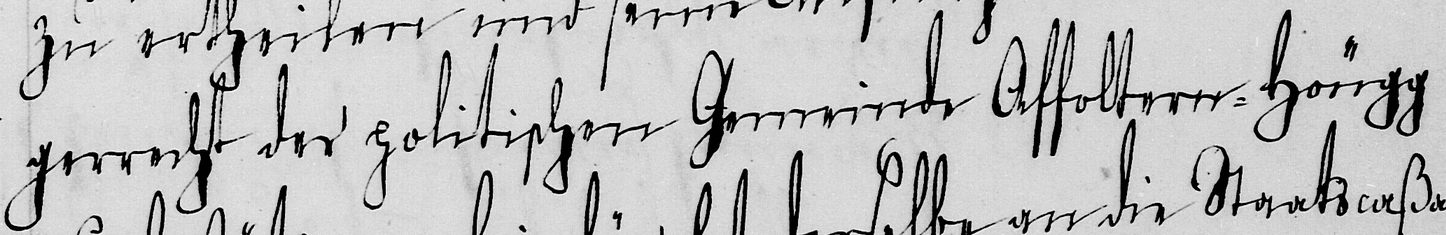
gerrecht der politischen Gemeinde Affoltern-Höngg
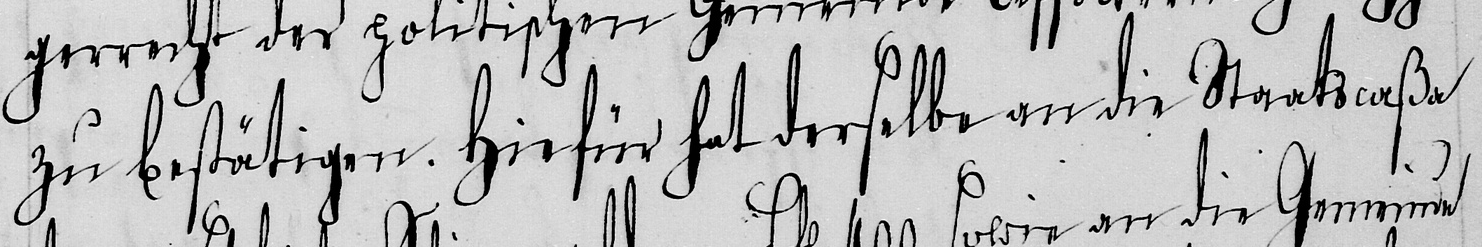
zu bestätigen. Hiefür hat derselbe an die Staatscaßa
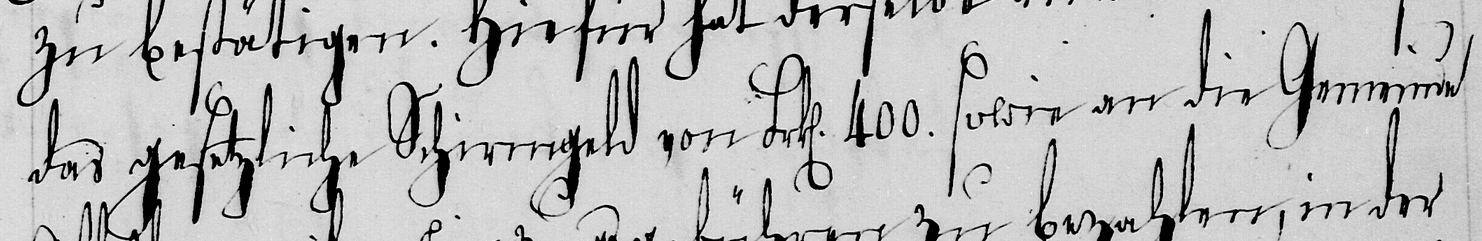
das gesetzliche Schirmgeld von Frk[en]. 400. sowie an die
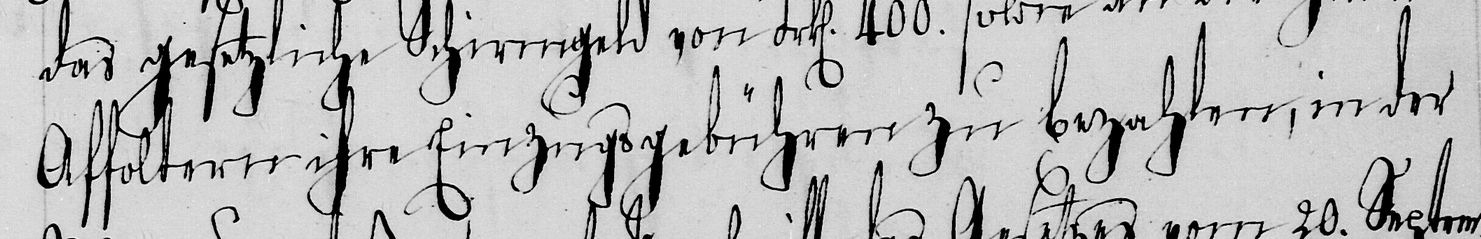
Affoltern ihre Einzugsgebühren zu bezahlen, in der
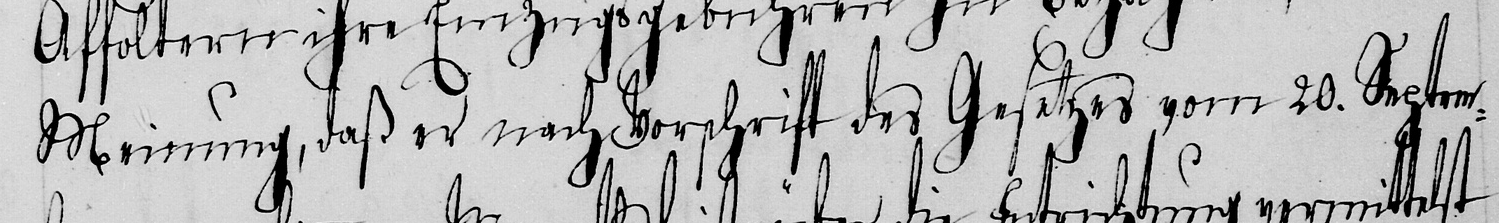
Meinung, daß er nach Vorschrift des Gesetzes vom 20. Septem¬
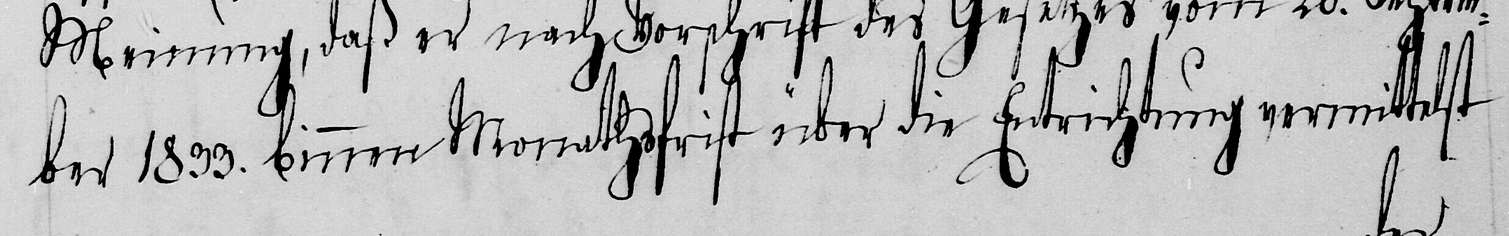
ber 1833. binnen Monathsfrist über die Entrichtung vermittelst
